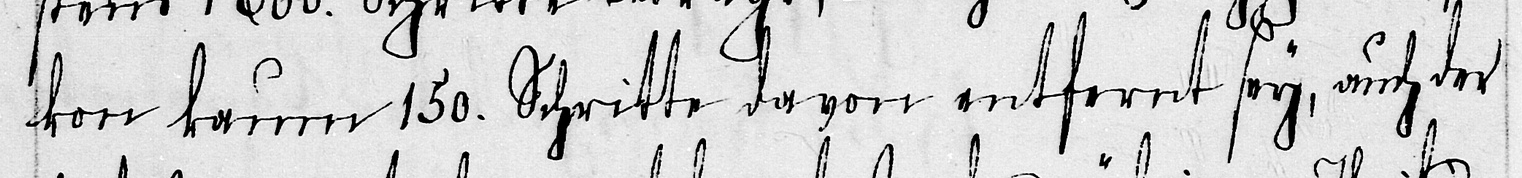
kon kaum 150. Schritte davon entfernt sey, auch der
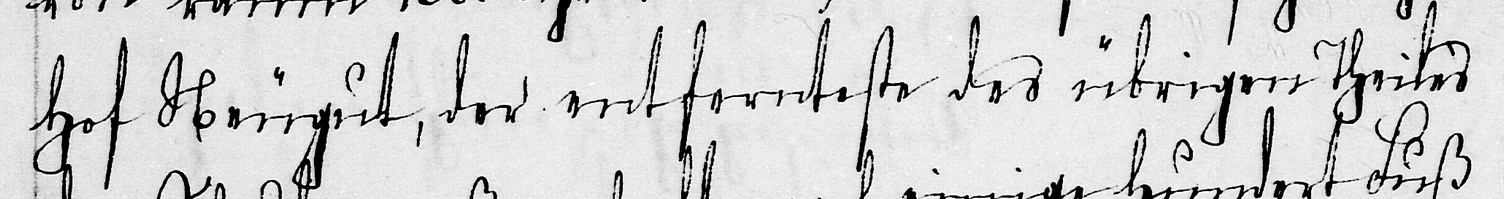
Hof Neugut, der entfernteste des übrigen Theiles
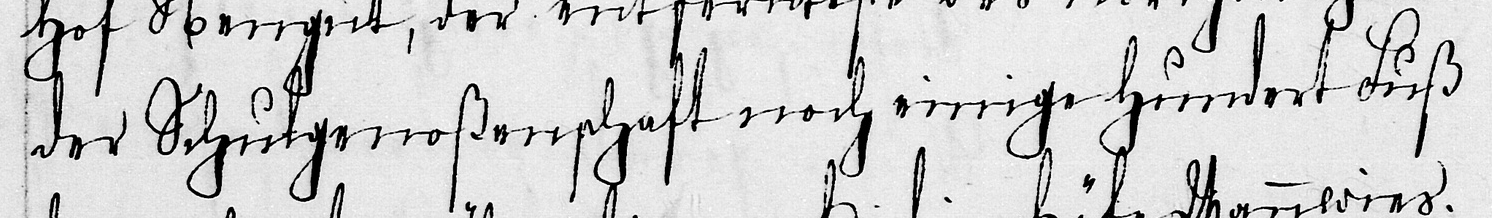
der Schulgenoßenschaft noch einige Hundert Fuß
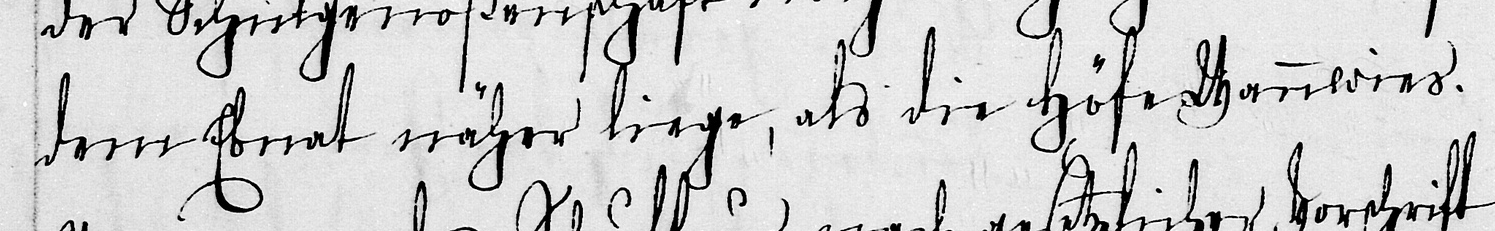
dem Ebnat näher liege, als die Höfe Wannwies.
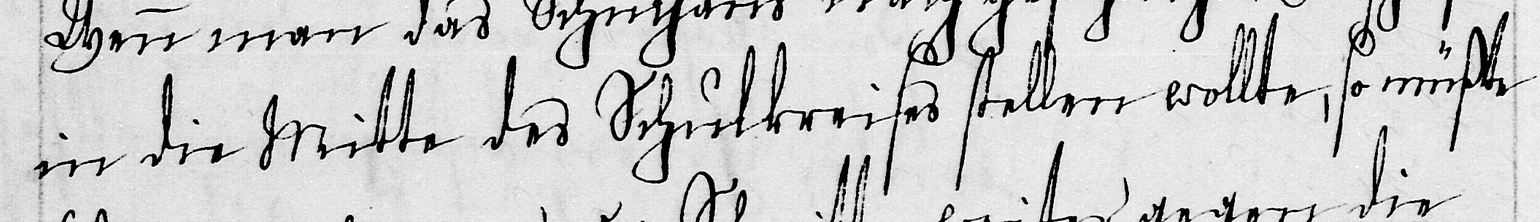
in die Mitte des Schulkreises stellen wollte, so müßte
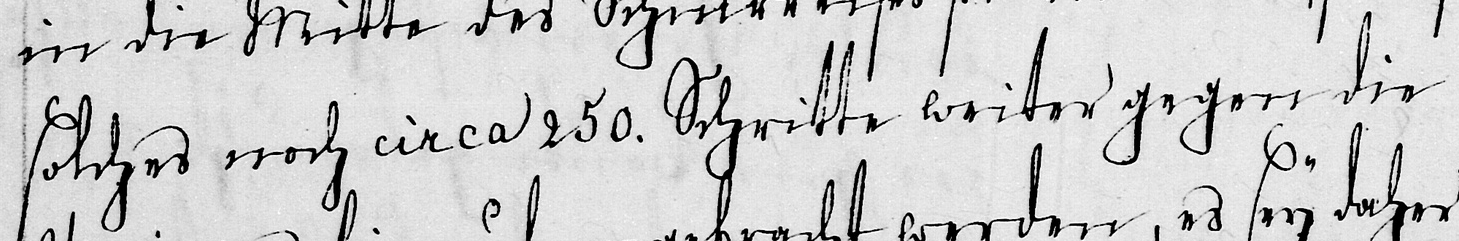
solches noch circa 250. Schritte weiter gegen die
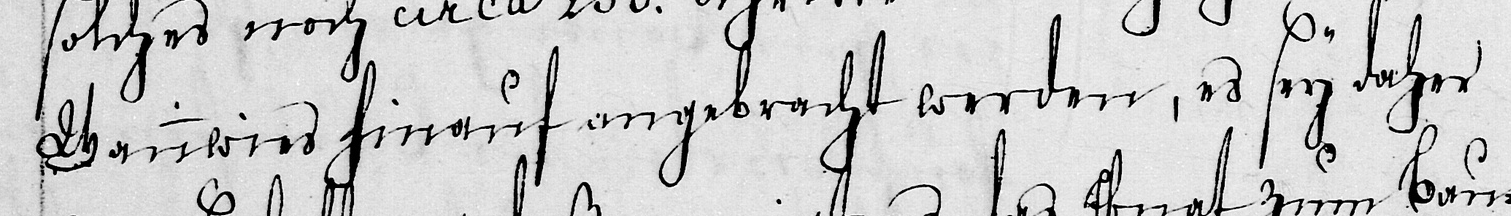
Wannwies hinauf angebracht werden, es sey daher
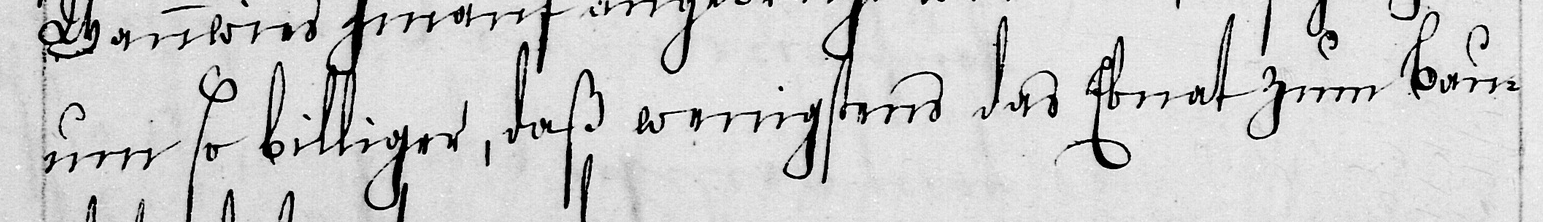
um so billiger, daß wenigstens das Ebnat zum Baup¬
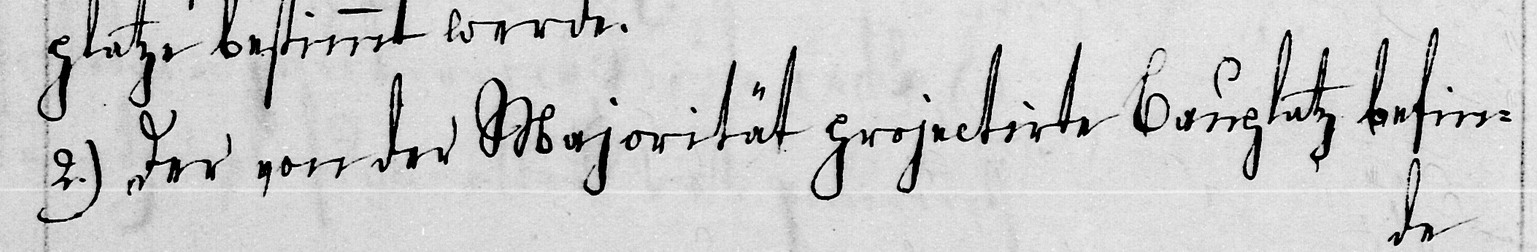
2.) Der von der Majorität projectirte Bauplatz befin-
